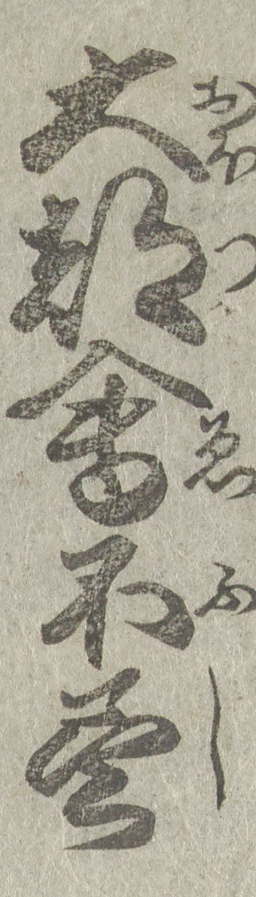大都会不尽
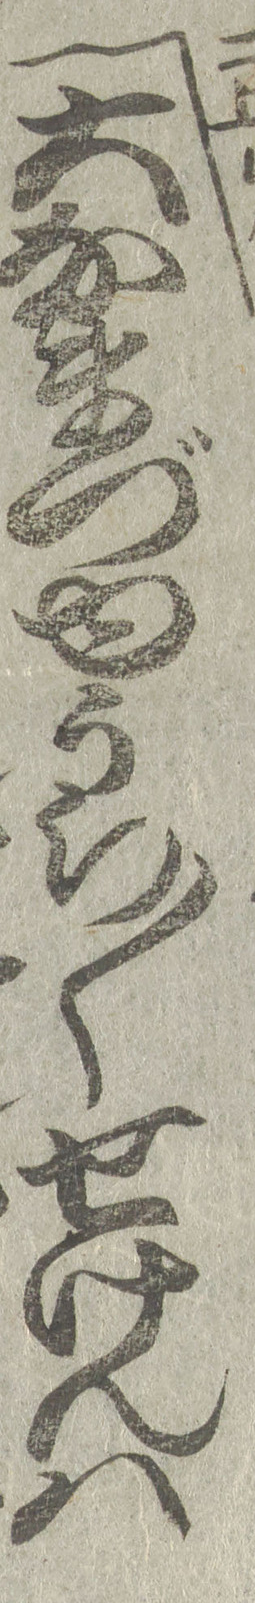｢大なまづゆうら〳〵せけんは
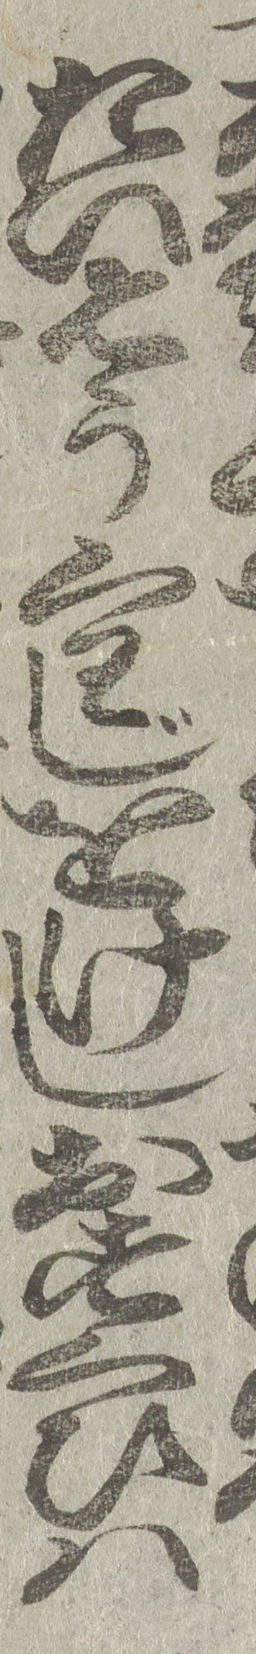たいそうくわじをけしおすくひは
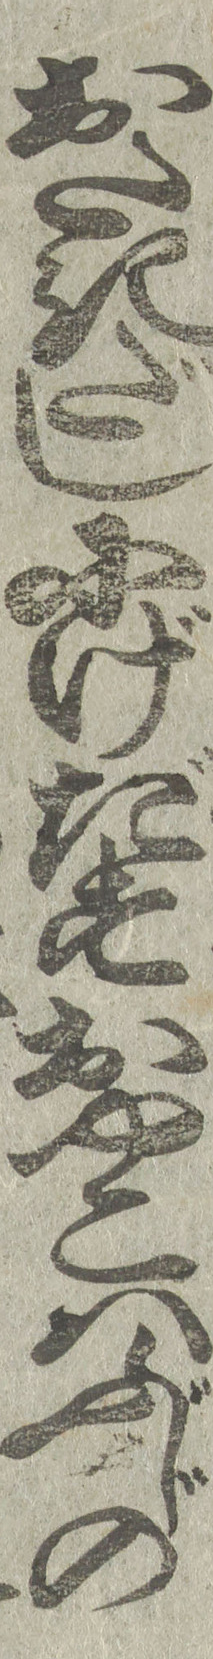おたきだしにげだすおやこはぶじの
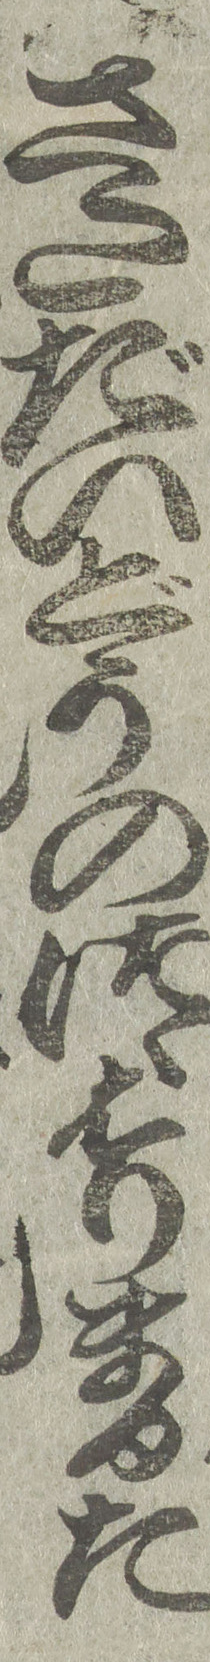さただいどうのつはりまるた
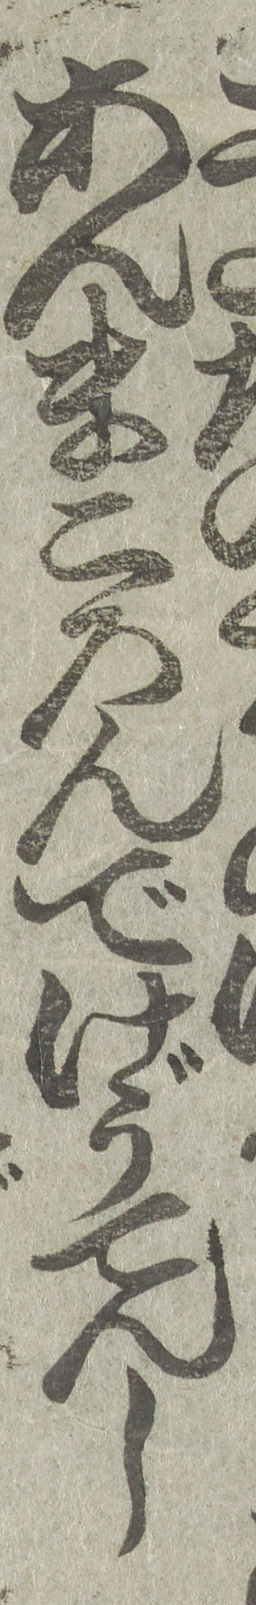あんまころんでげうてんし
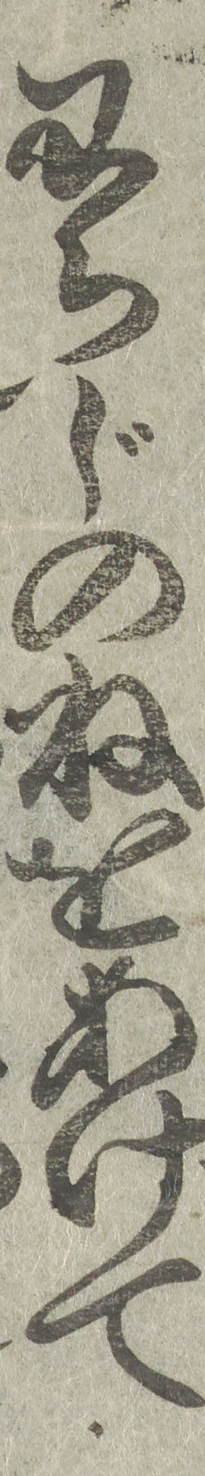わらじのねをあげて
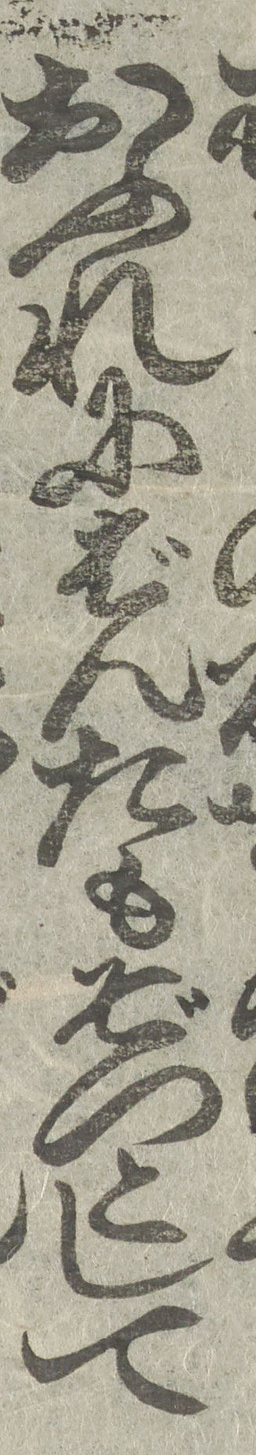おふれにばんたもぞつとして
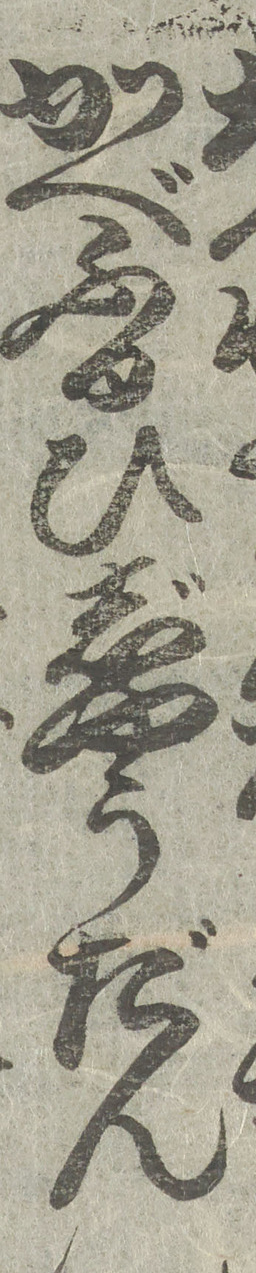かべふるひじやうだん
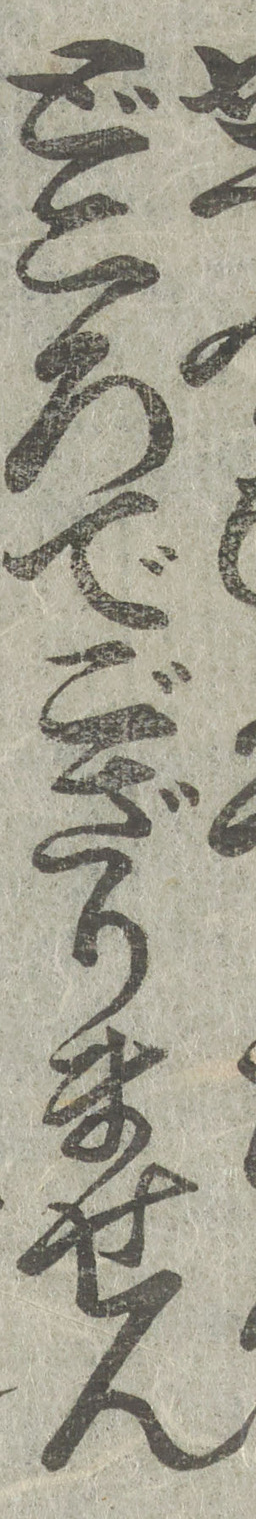どころでござりません
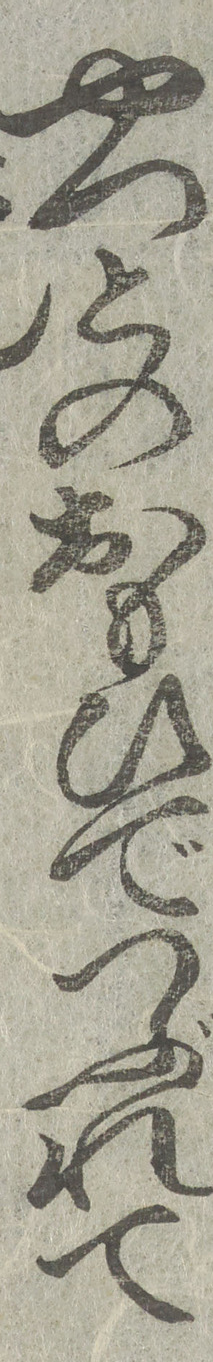やつとのおもひでつぶれて
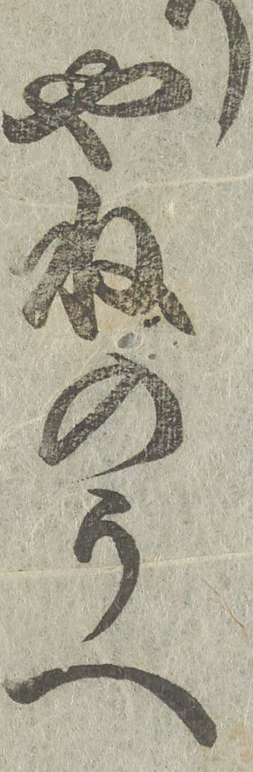やねのうへ
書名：大都会不尽
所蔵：東京大学総合図書館 General Library in the University of Tokyo, JAPAN
